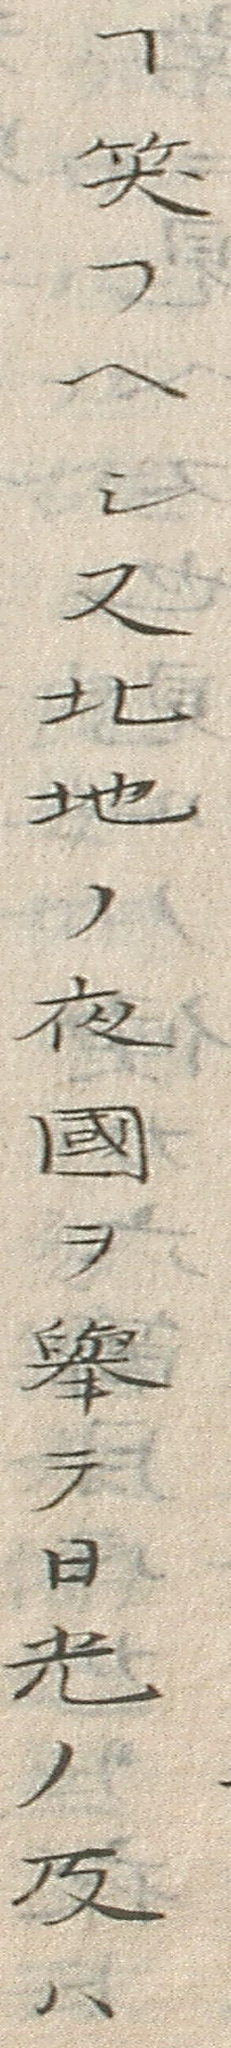コト笑フヘシ又北地ノ夜国ヲ挙テ日光ノ及ハ
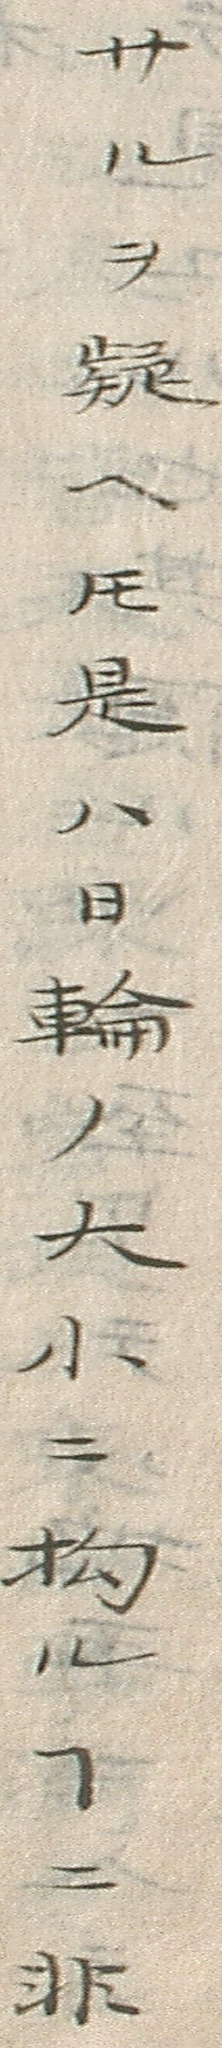サルヲ疑ヘトモ是ハ日輪ノ大小ニ拘ルコトニ非
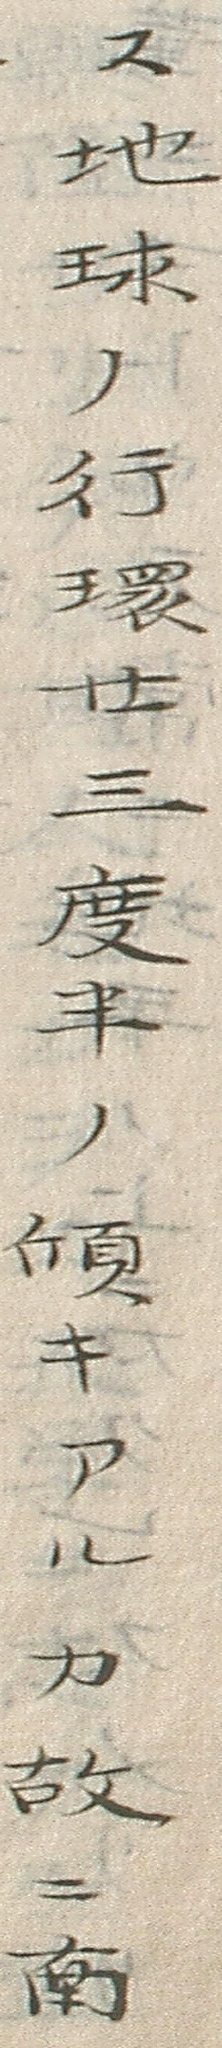ス地球ノ行環廿三度半ノ傾キアルカ故ニ南
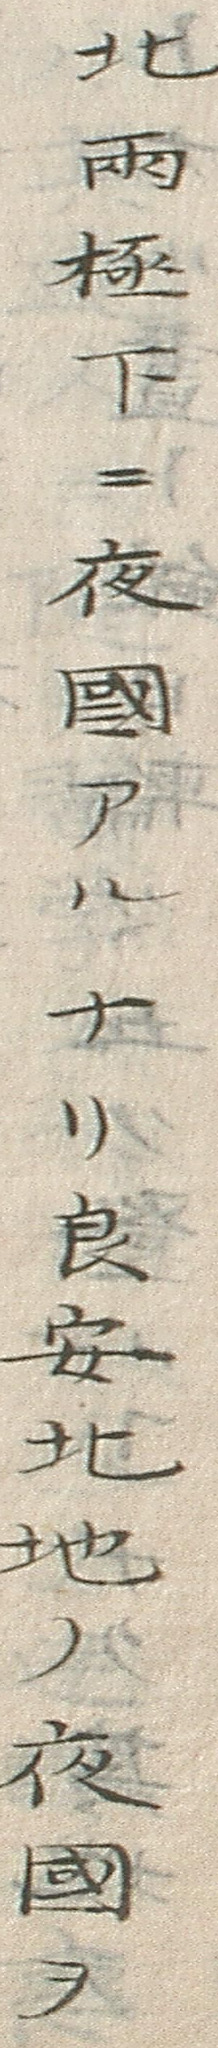北両極下ニ夜国アルナリ良安北地ノ夜国ヲ
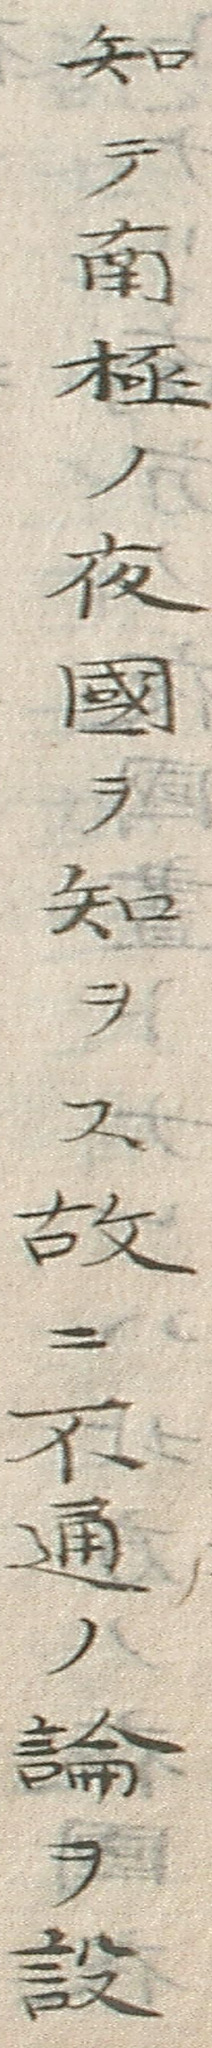知テ南極ノ夜国ヲ知ラス故ニ不通ノ論ヲ説
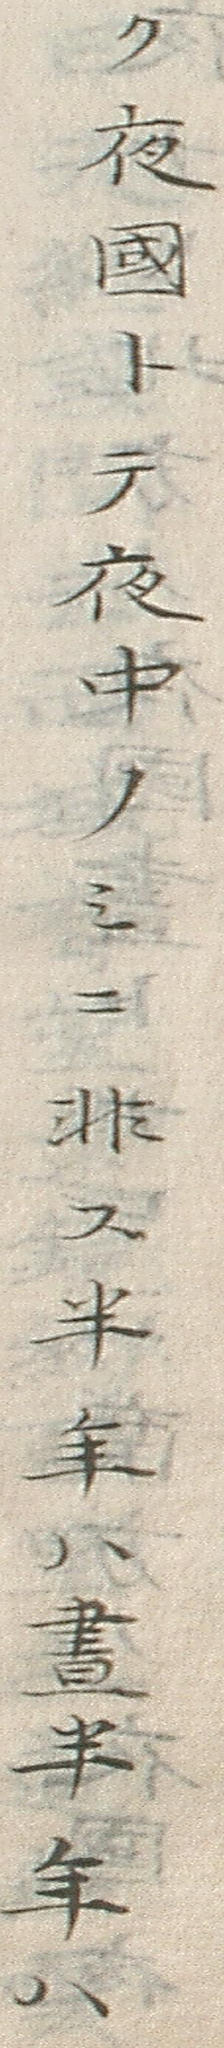ク夜国トテ夜中ノミニ非ス半年ハ昼半年ハ

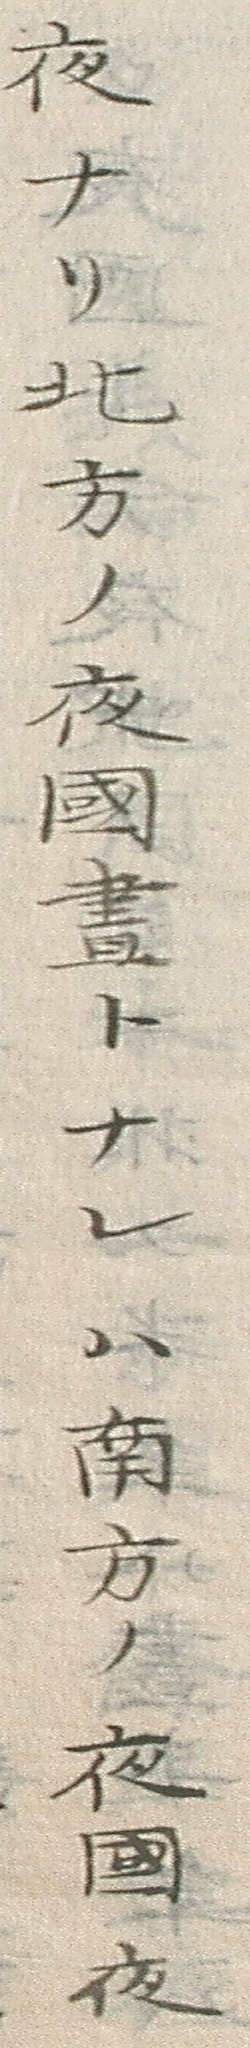夜ナリ北方ノ夜国昼トナレハ南方ノ夜国夜
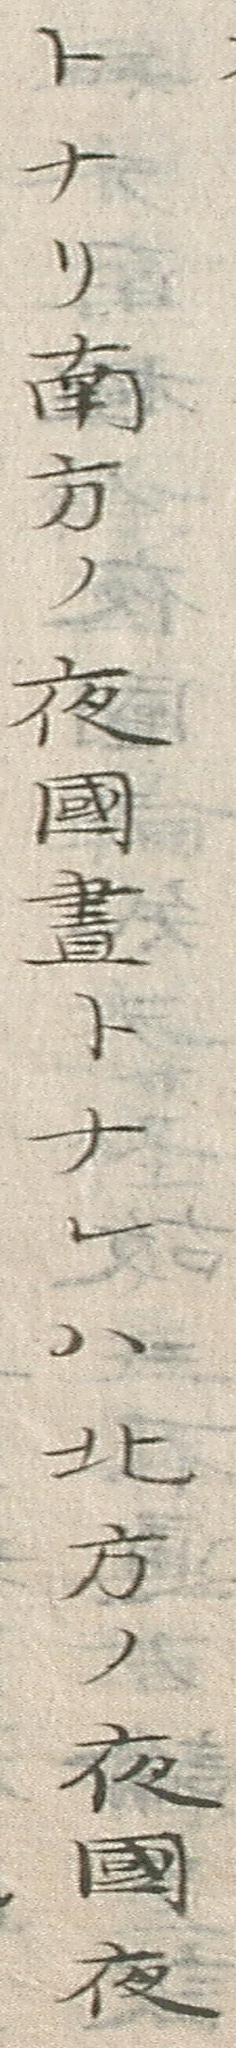トナリ南方ノ夜国昼トナレハ北方ノ夜国夜
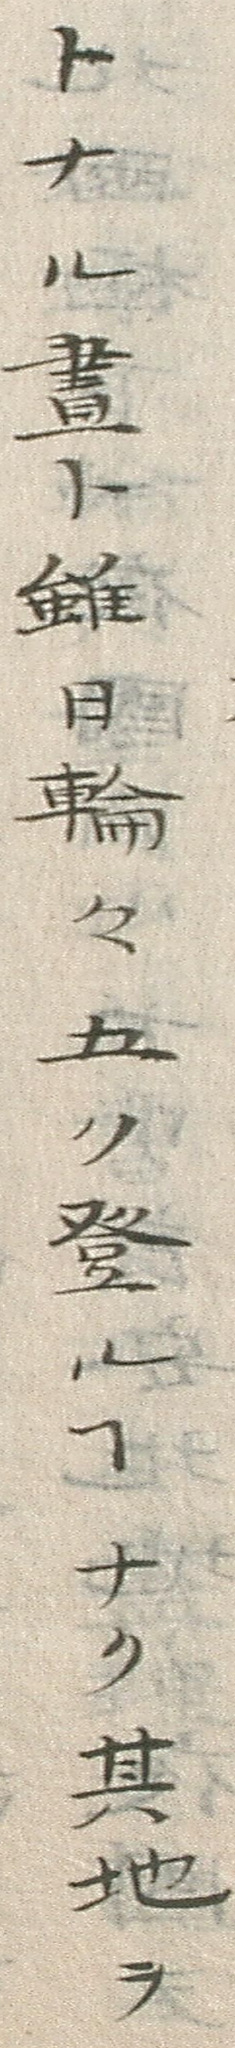トナル昼ト雖日輪々全ク登ルコトナク其地ヲ
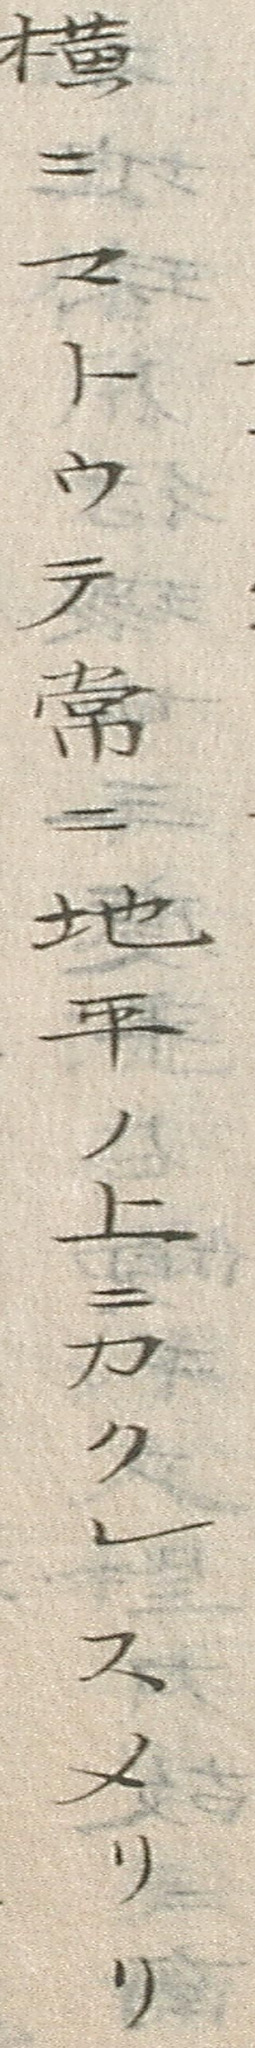横ニマトウテ常ニ地平ノ上ニカクレスメリリ
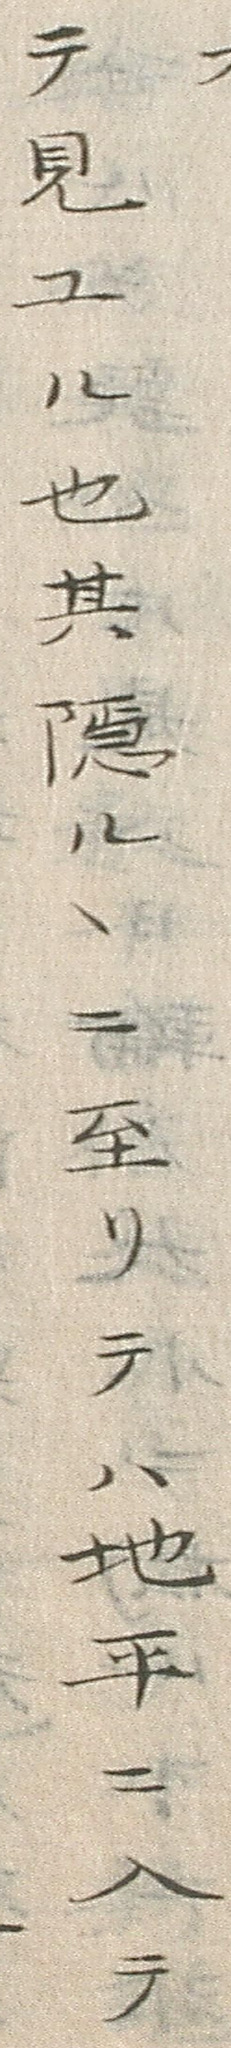テ見ユル也其隠ルヽニ至リテハ地平ニ入テ
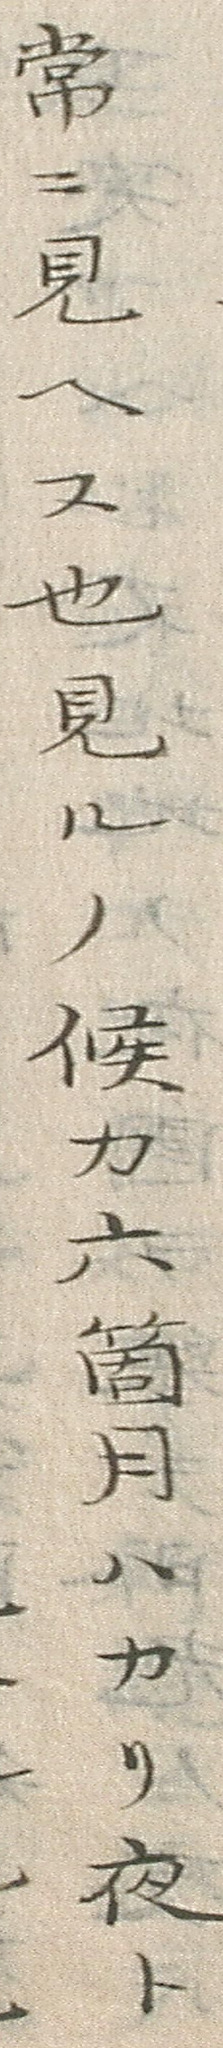常ニ見ヘス也見ルノ候カ六箇月ハカリ夜ト
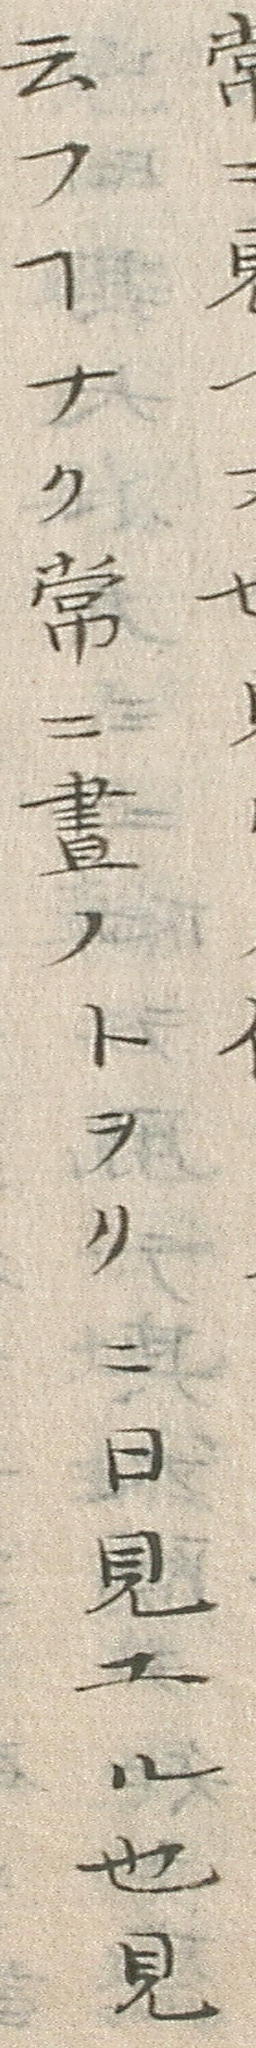云フコトナク常ニ昼ノトヲリニ日見ユル也見
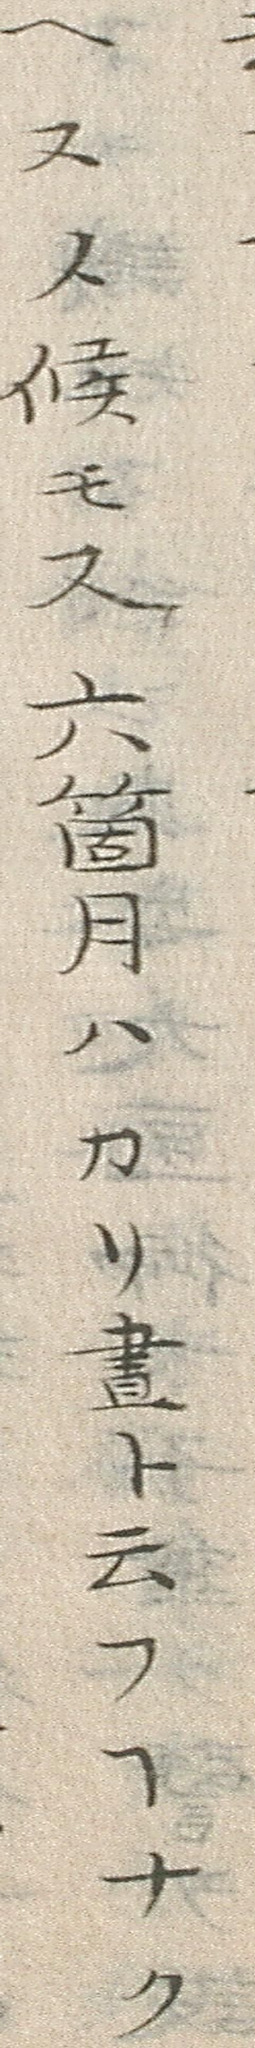ヘスシテ候モ又六箇月ハカリ昼ト云フコトナク
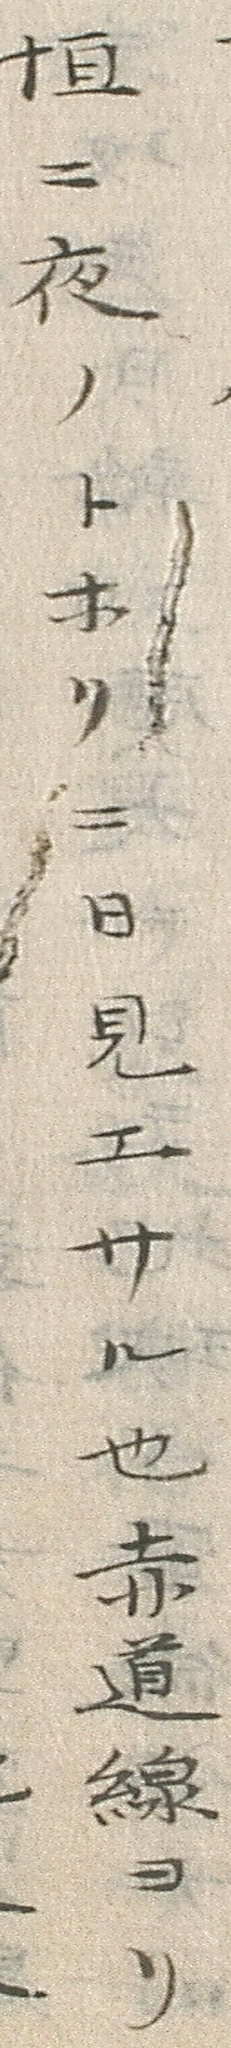恒ニ夜ノトホリニ日見エサル也赤道線ヨリ
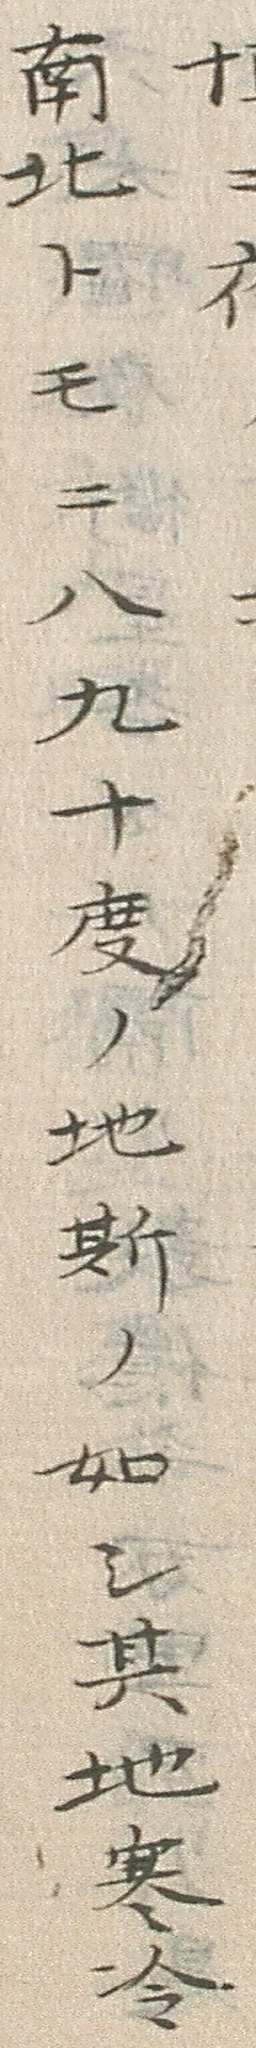南北トモニ八九十度ノ地斯ノ如シ其地寒冷
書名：天學略名目羽翼　全
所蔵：東京大学地震研究所図書室 Earthquake Research Institute Library, The University of Tokyo, JAPAN
